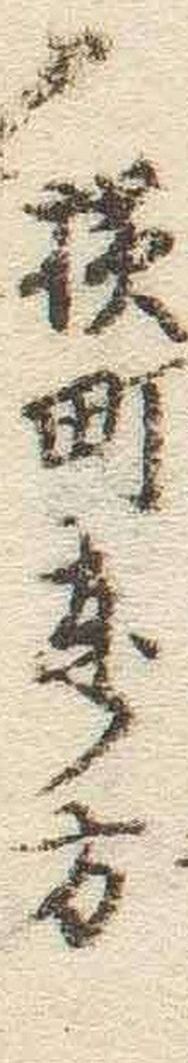横町東ノ方
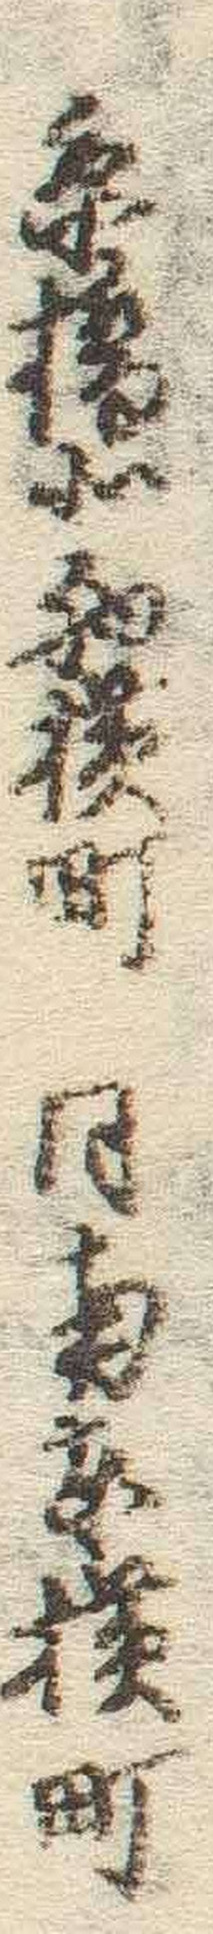京橋北西横町同南東横町
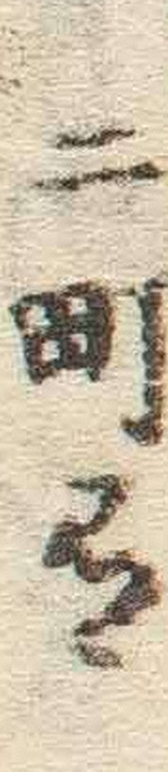二町有
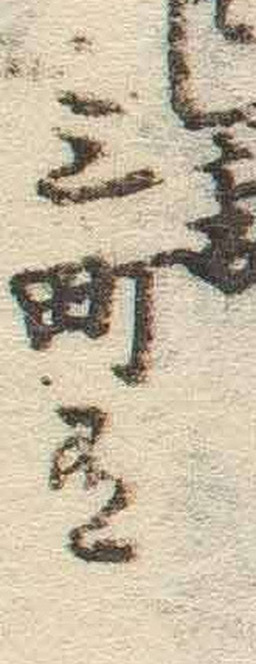三町有

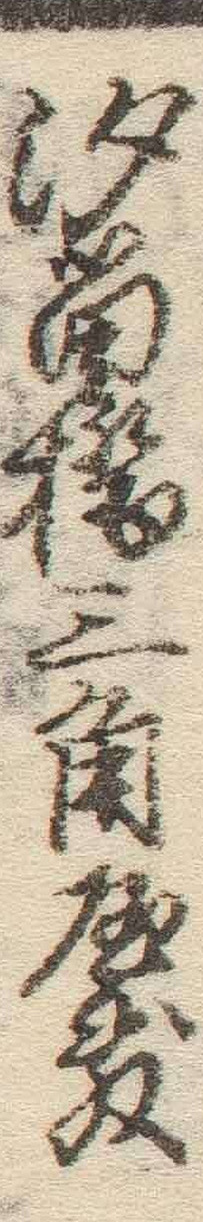汐留橋三角屋敷
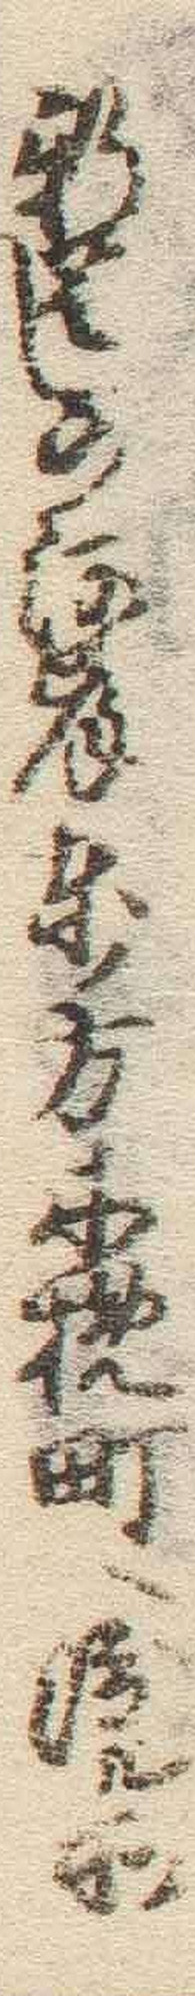新はしの河岸東ノ方木挽町へ渡ル所
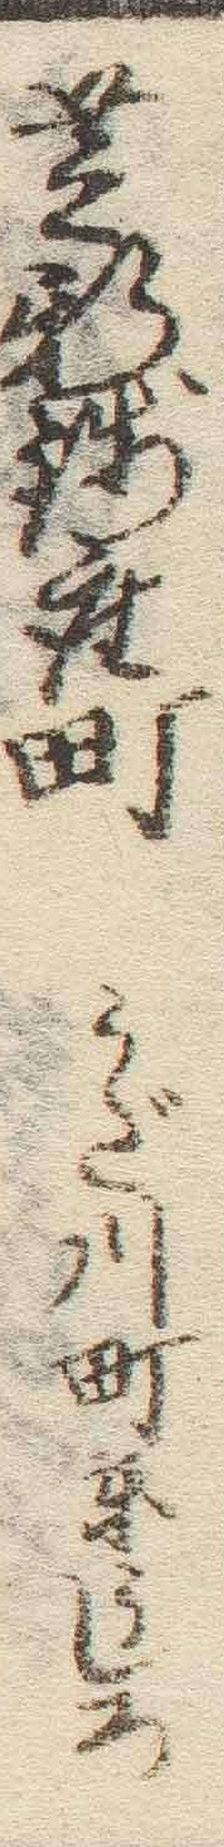芝新銭座町うだ川町東うしろ
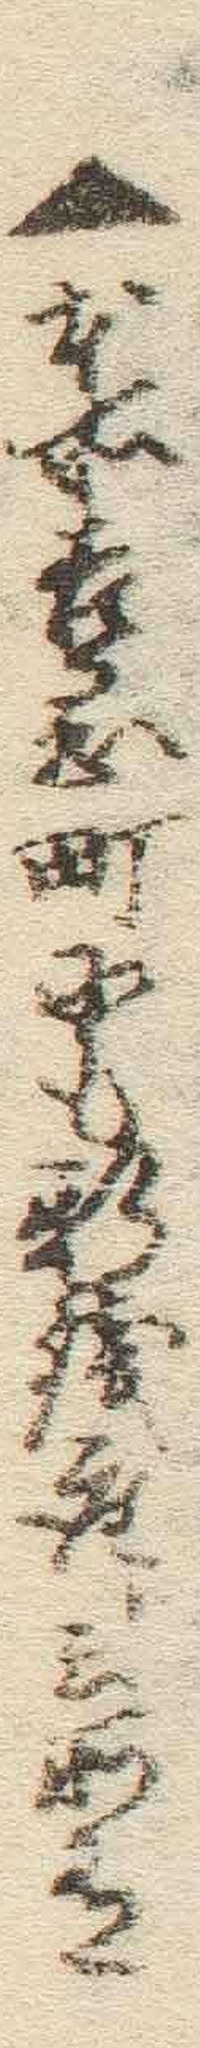▲本所吉岡町にも新銭座ト云所有
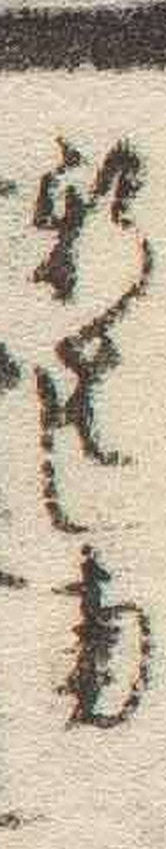新はし南
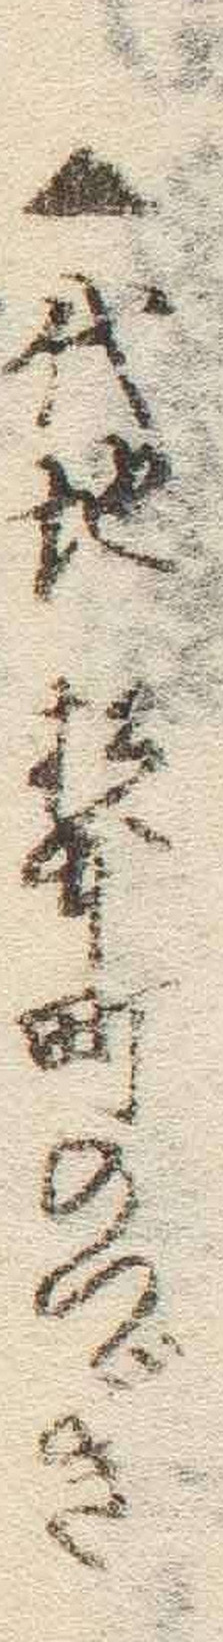▲代地松本町のつゞき
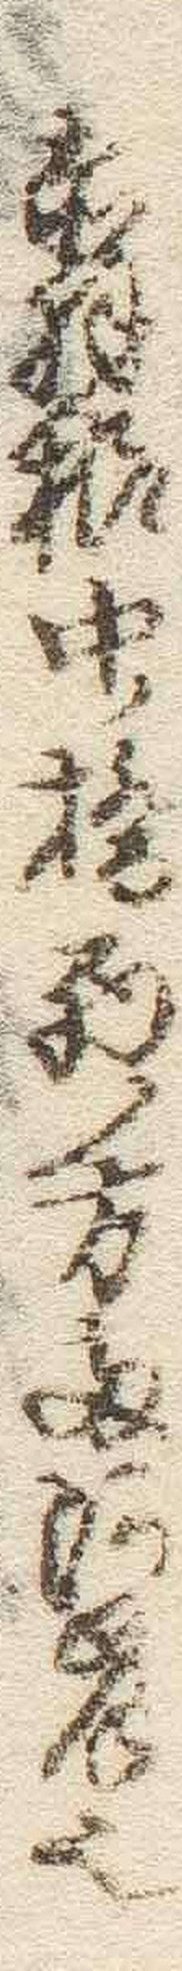赤羽根中ノ橋西ノ方両河岸也
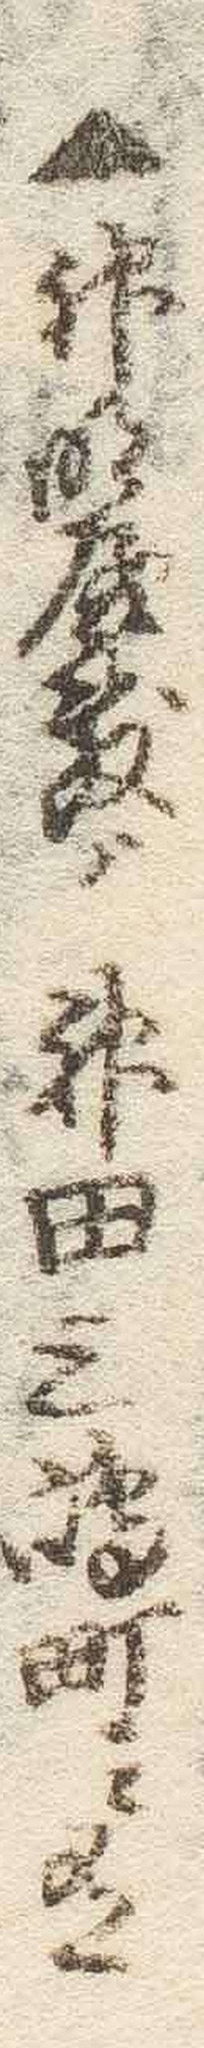▲神明屋敷は神田三島町に有
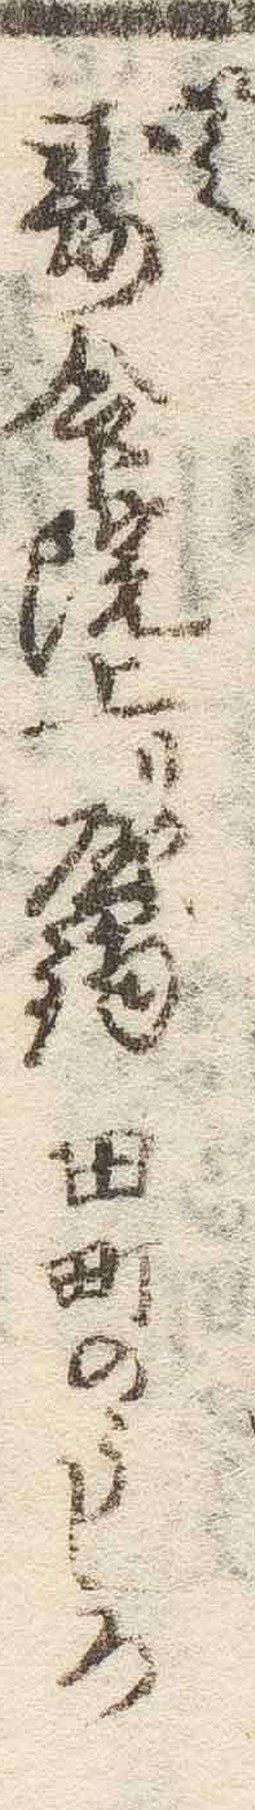寿命院上り屋敷田町のうしろ
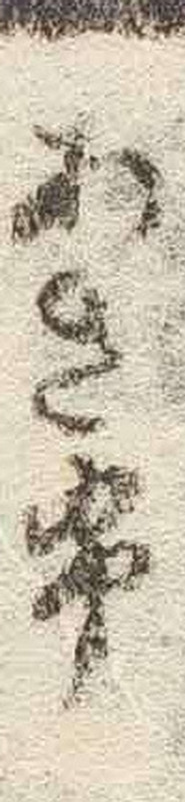あさふ
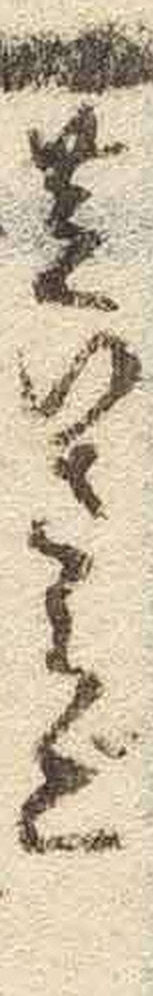芝いさらご
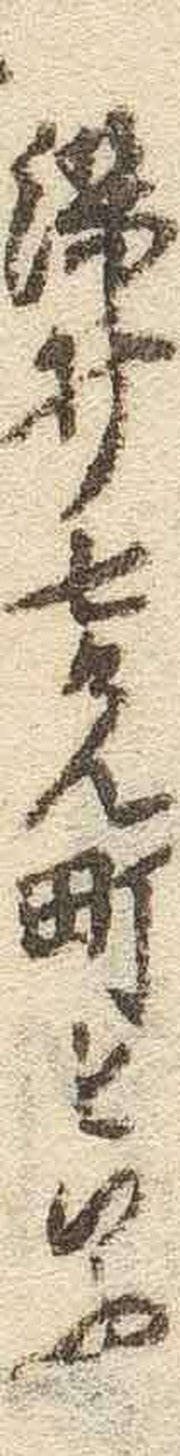染井七けん町といふ
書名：江戸町独案内
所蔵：東京学芸大学附属図書館 国文学研究資料館
